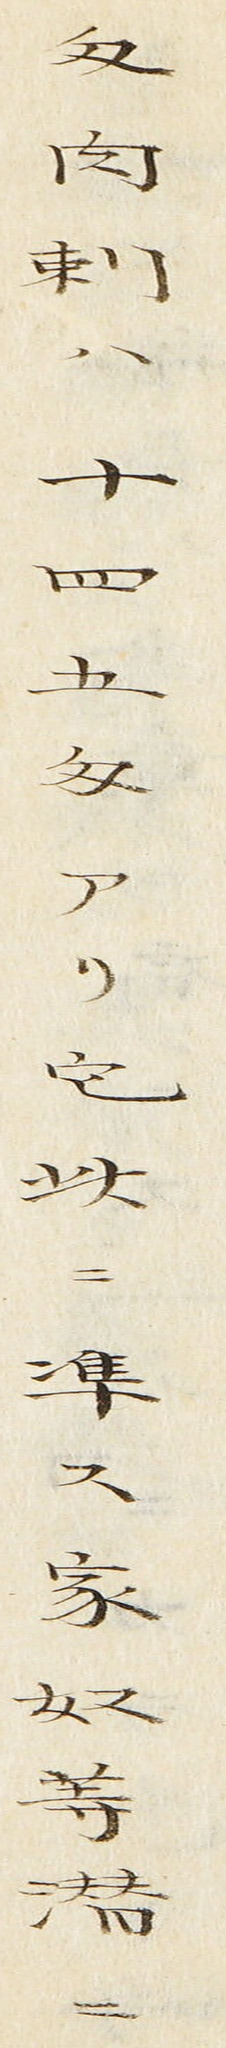匁肉刺ハ十四五匁アリ此ニ準ス家奴等潜ニ
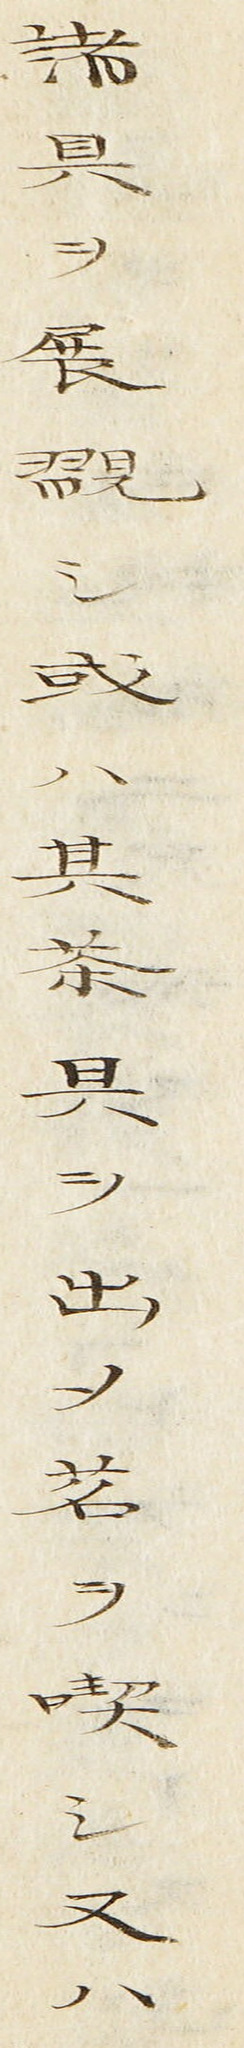諸具ヲ展観？シ或ハ其茶具ヲ出シテ茗ヲ喫シ又ハ
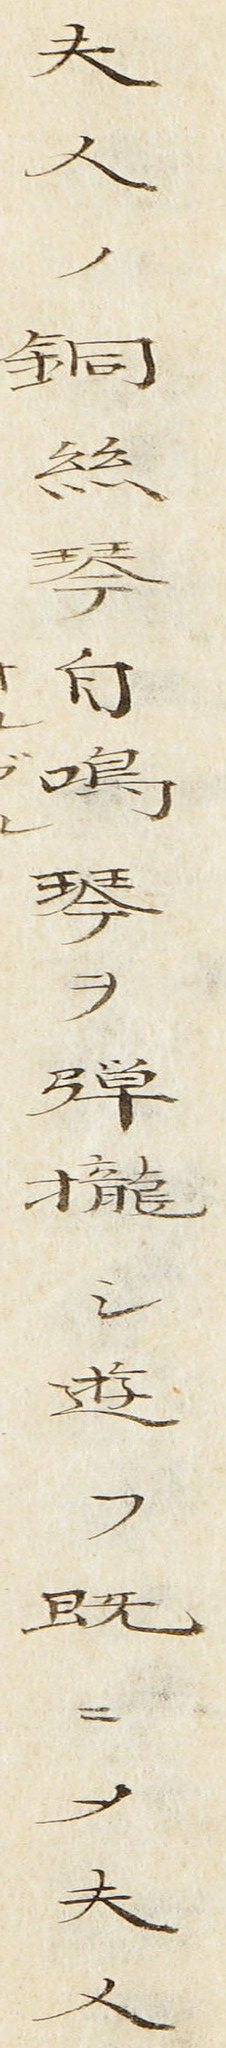夫人ノ銅絲琴自鳴琴ヲ弾攏シ遊フ既ニシテ夫人
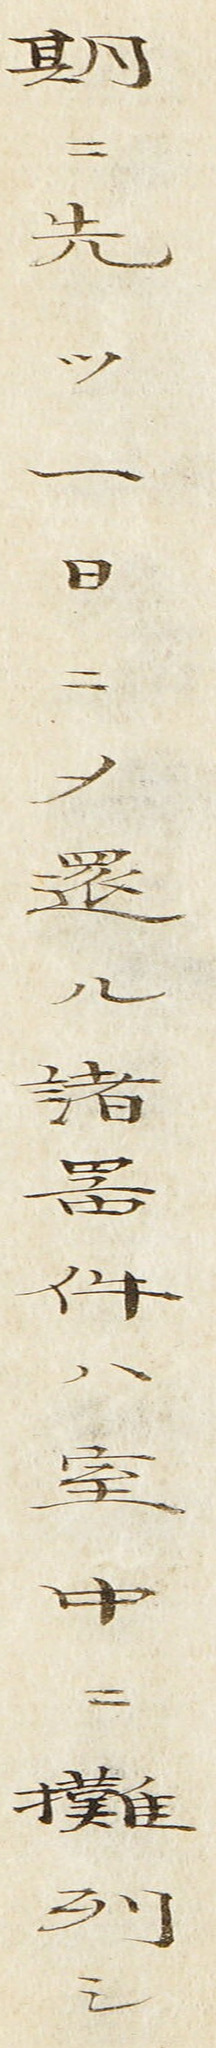期ニ先ツ一日ニシテ還ル諸器件ハ室中ニ攤列シ
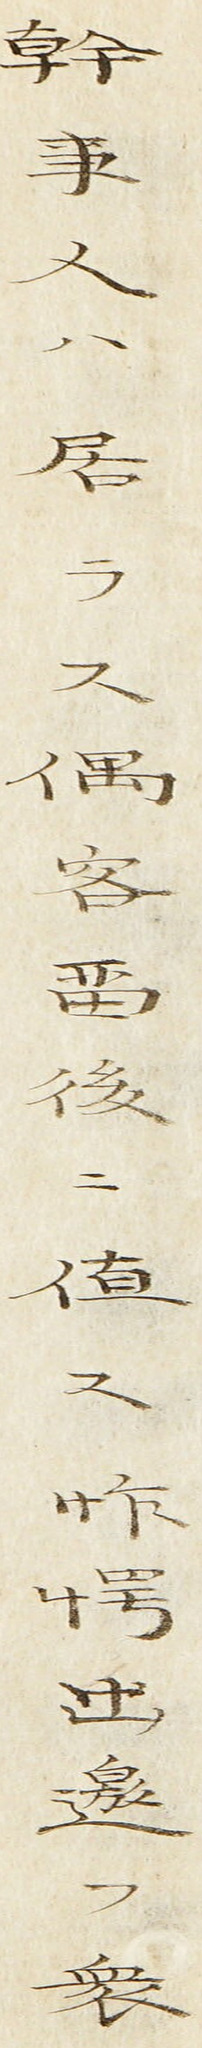幹事人ハ居ラス偶客後ニ値ス怍愕出邀フ衆
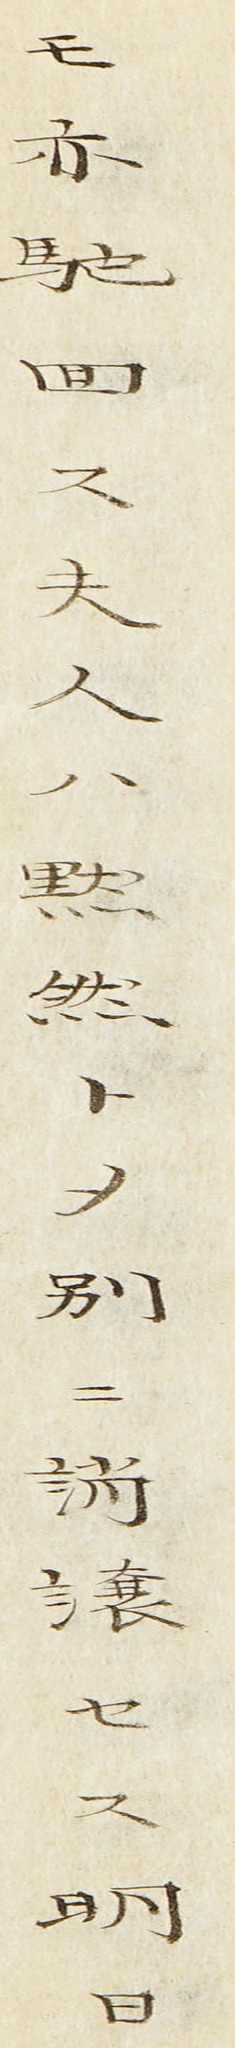モ亦馳回ス夫人ハ黙然トシテ別二誚譲セス明日
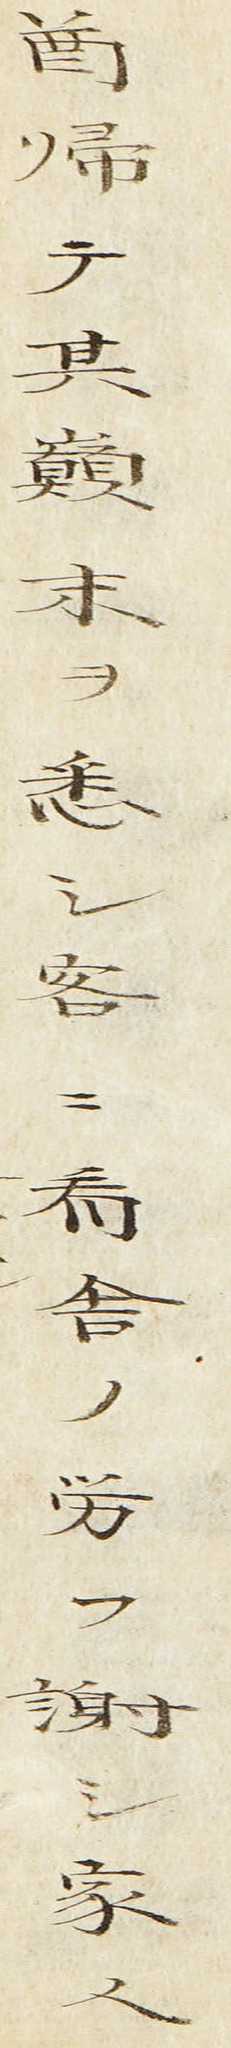酋帰テ其巓末ヲ悉シ客ニ看舎ノ労フ謝シ家人
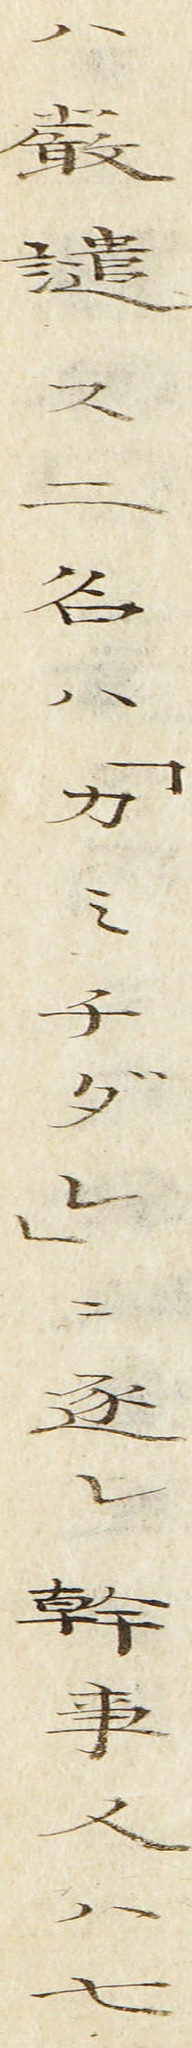ハ厳譴ス二名ハ「カミチダレ」ニ逐レ幹事人ハ七

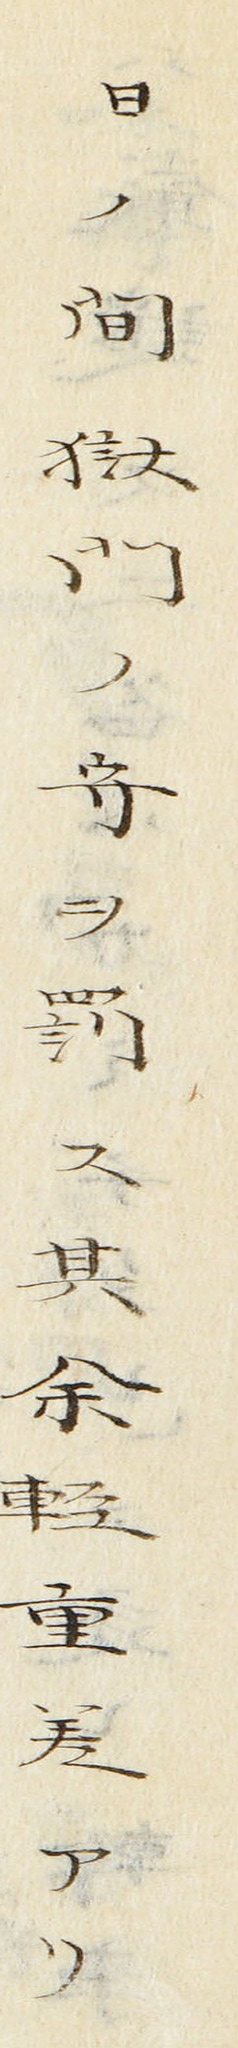日ノ間獄門ノ守ヲ罰ス其余軽重差アリ
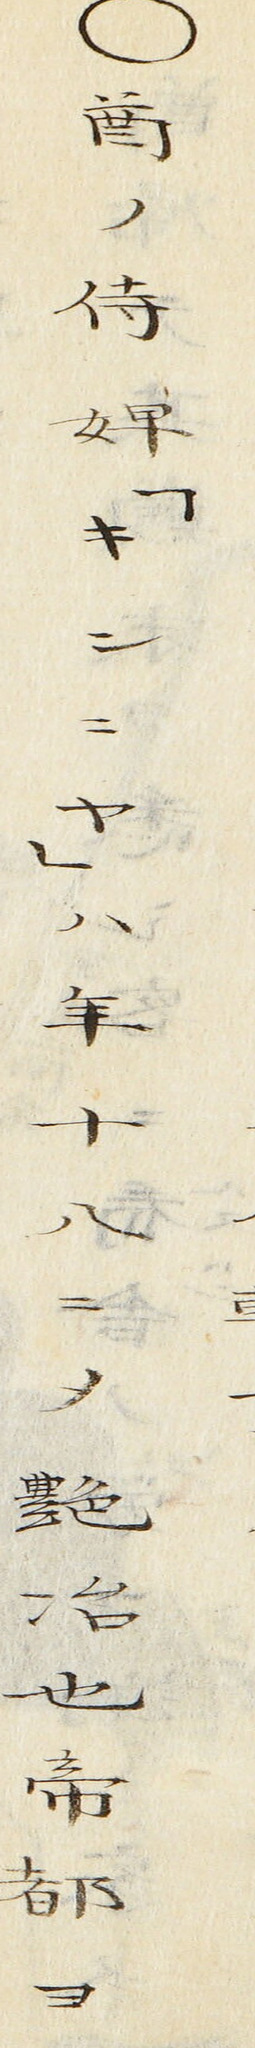〇酋ノ侍婢「キンニヤ」ハ年十八ニシテ艶冶也帝都ヨ
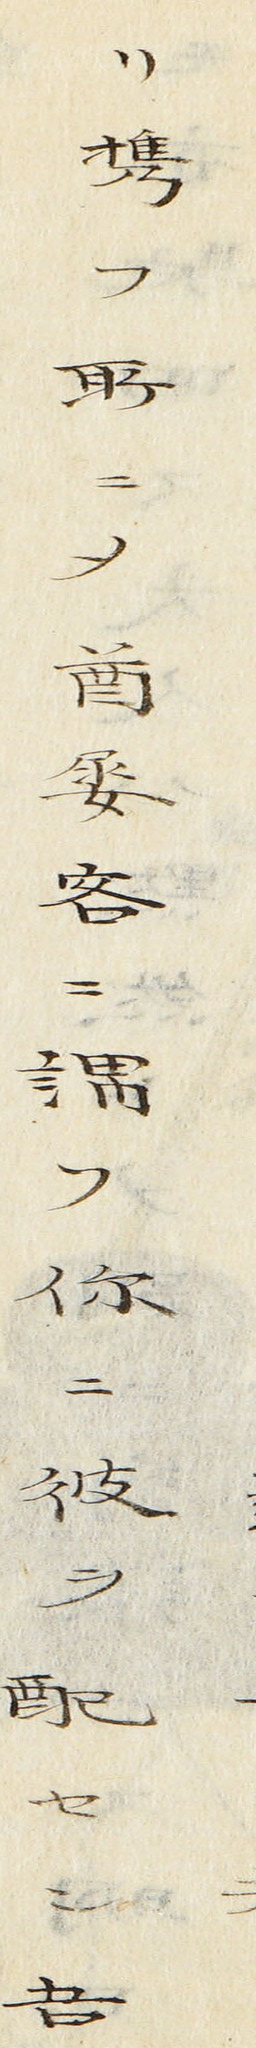リ携フ所ニシテ酋屡客ニ謂フ你ニ彼ヲ配セン吾
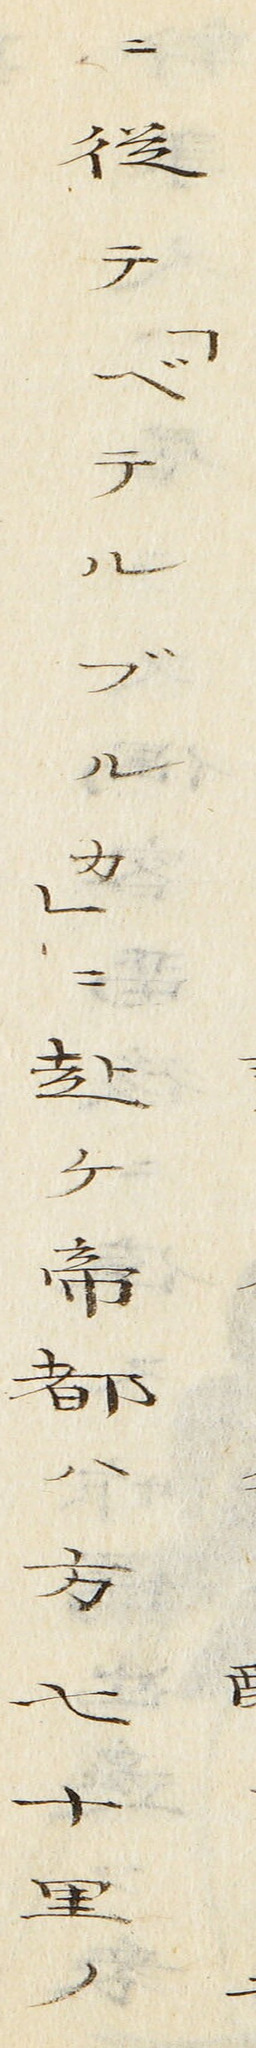ニ従テ「ベテルブルカ」ニ赴ケ帝都ハ方七十里ノ
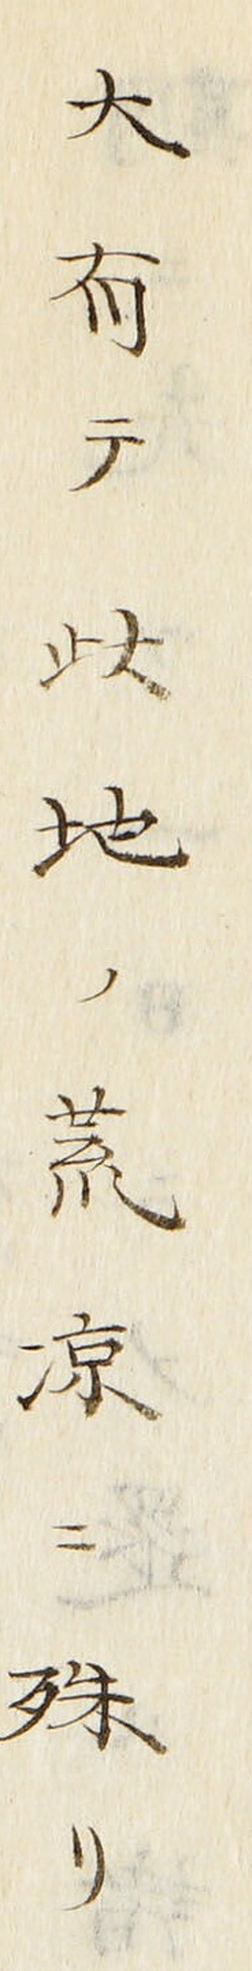大有テ此地ノ荒涼ニ殊リ
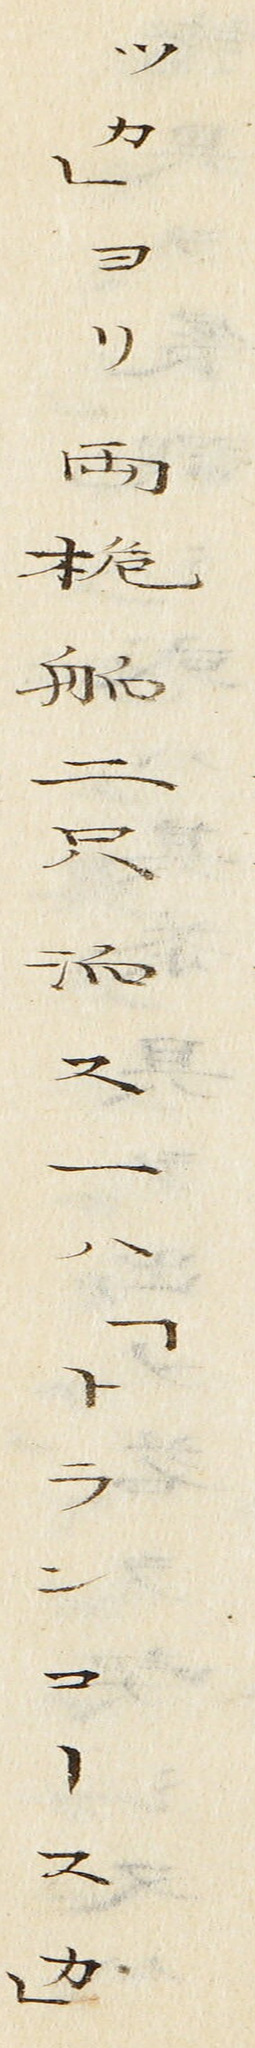ツカ」ヨリ両桅舶ニ只泊ス一ハ「トランコースカ」
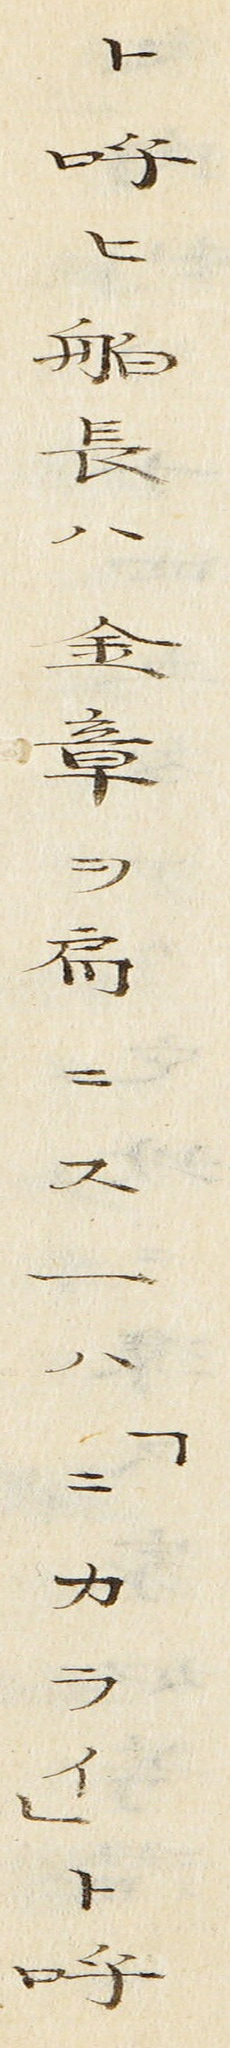ト呼ヒ舶長ハ金章ヲ肩ニシス一ハ「ニカライ」ト呼
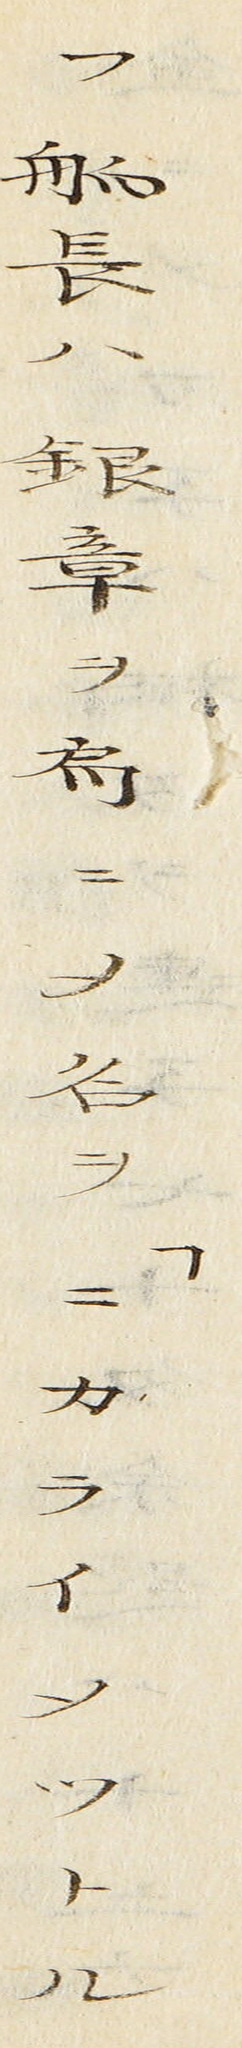フ舶長ハ銀章ヲ肩ニシテ名ヲ「ニカライメツトル
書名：蕃談
